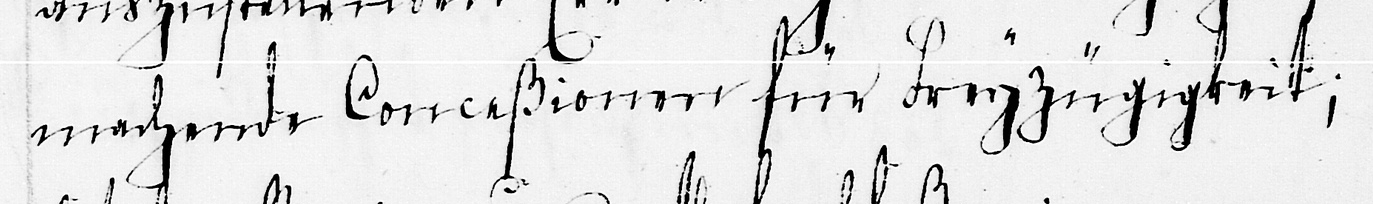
machende Conceßionen für Freyzügigkeit;
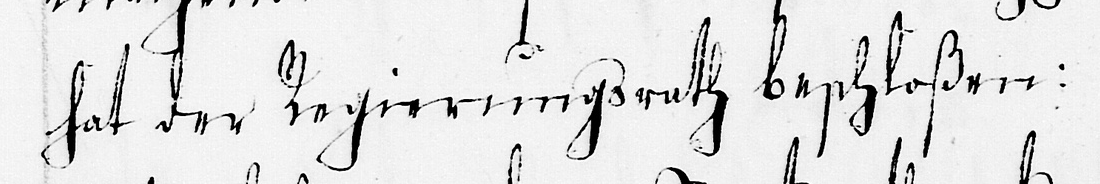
hat der Regierungsrath beschloßen:
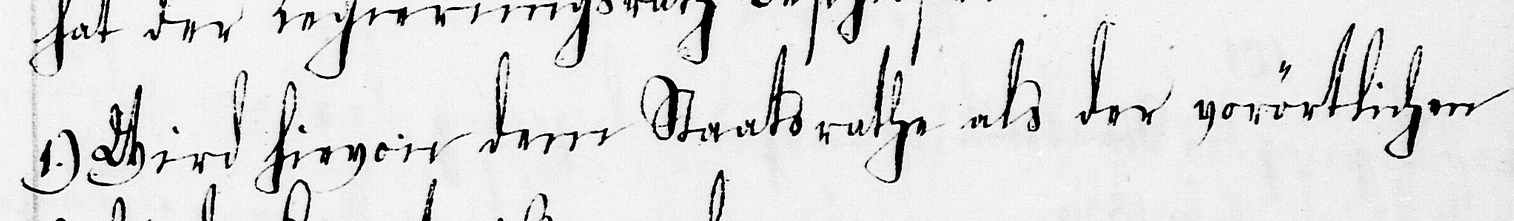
1.) Wird hievon dem Staatsrathe als der vorörtlichen
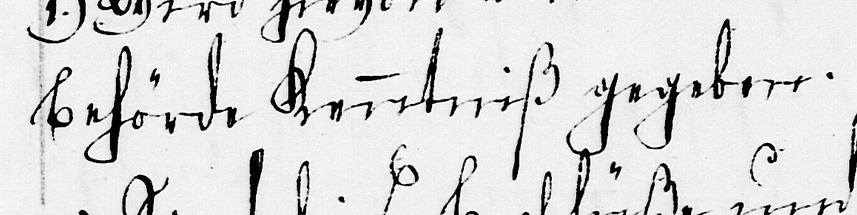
Behörde Kenntniß gegeben.
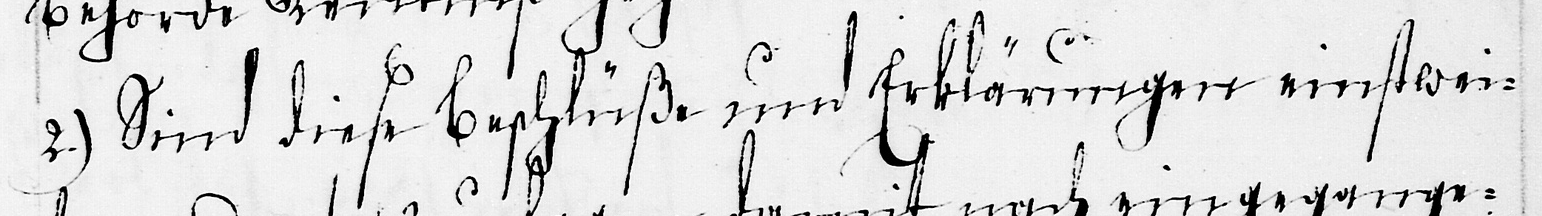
2.) Sind diese Beschlüße und Erklärungen einstwei¬
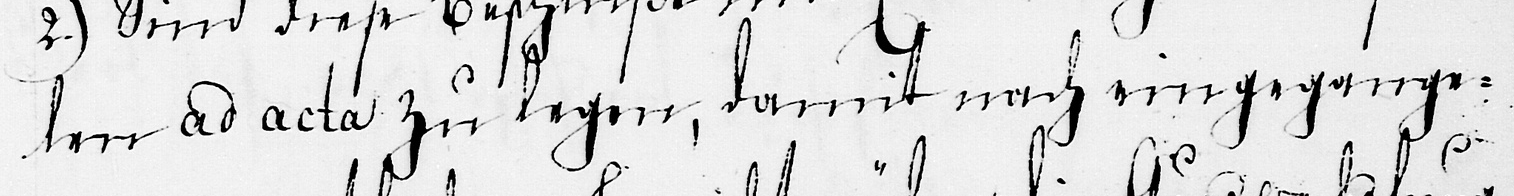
len ad acta zu legen, damit nach eingegange¬
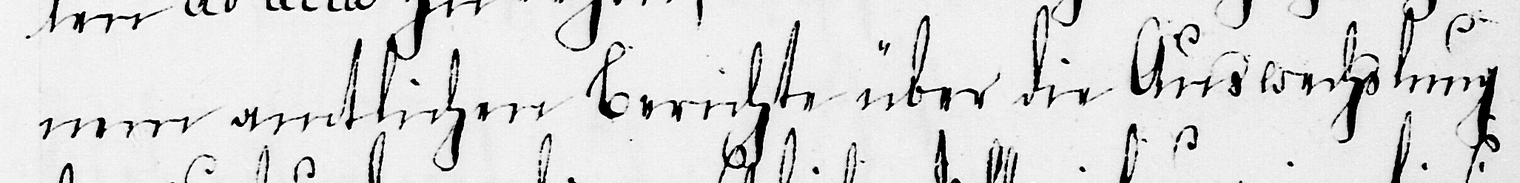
nem amtlichen Berichte über die Auswechslung
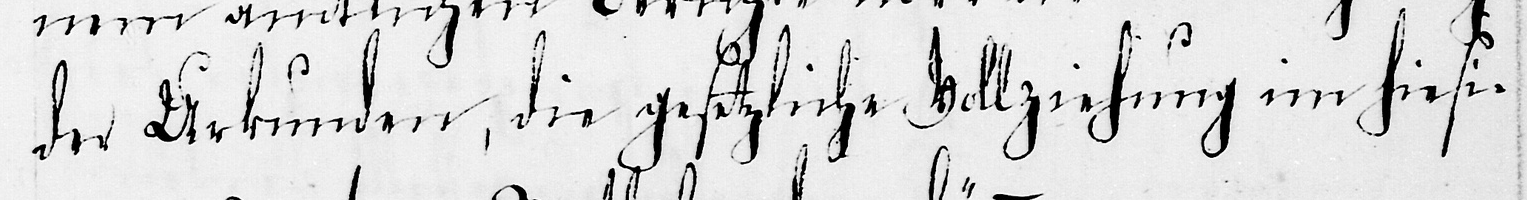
der Urkunden, die gesetzliche Vollziehung im hiesi¬
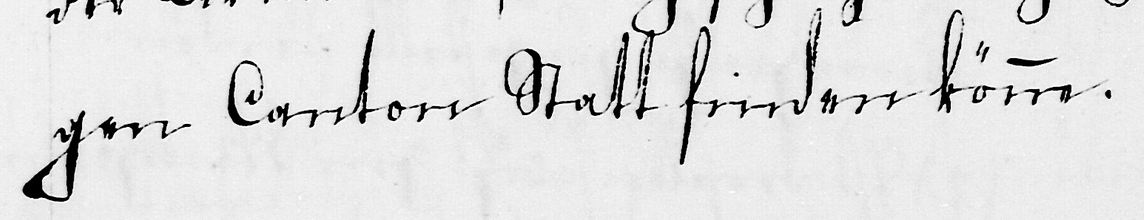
gen Canton Statt finden könne.
